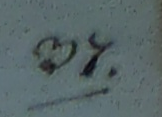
37.
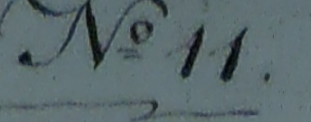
No͇ 11.
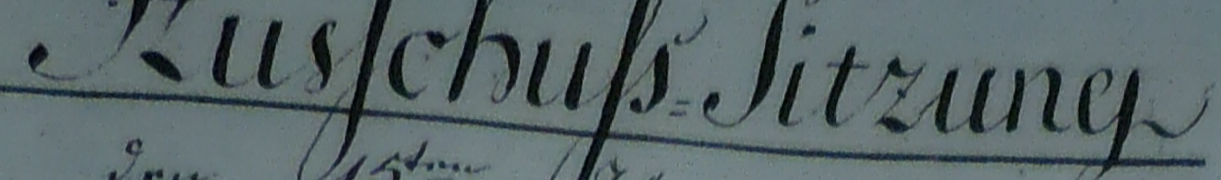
Ausschuss‗Sitzung
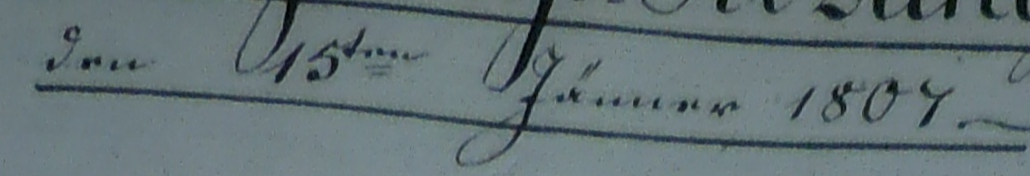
den 15te͇n Jänner 1807.
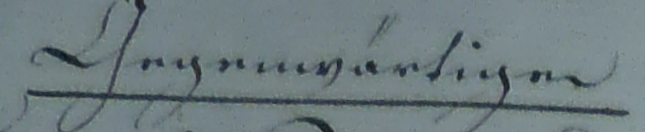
Gegenwärtige
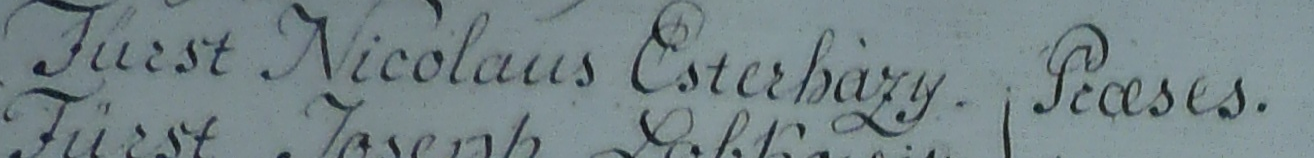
Fürst Nicolaus Esterhàzy Præses.
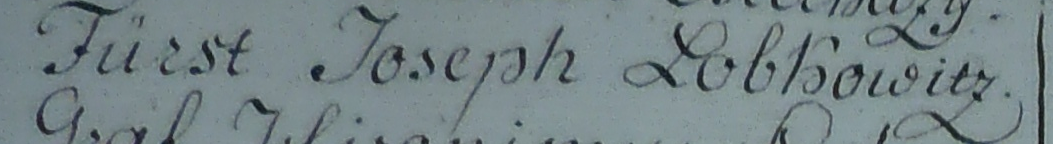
Fürst Joseph Lobkowitz.
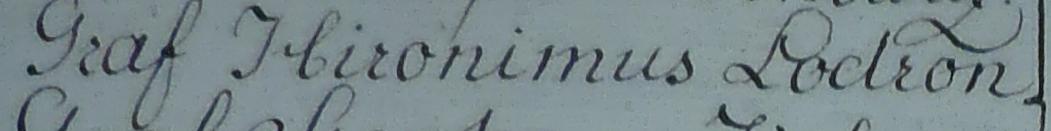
Graf Hironimus Lodron
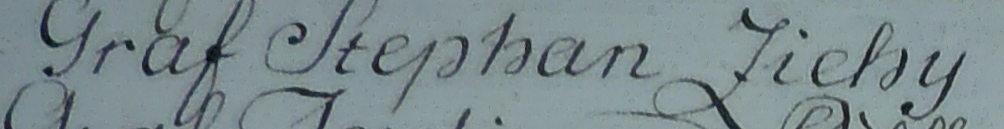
Graf Stephan Zichy
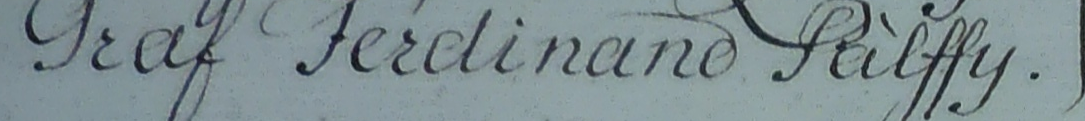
Graf Ferdinand Pàlffy.
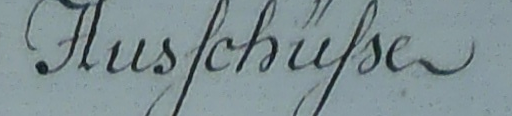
Ausschüsse
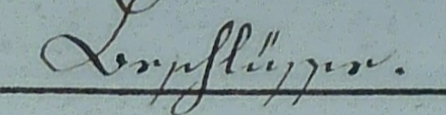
Beschlüsse.
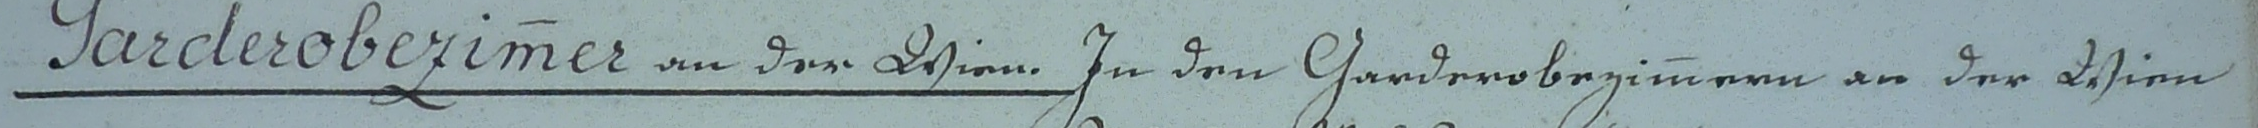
Garderobezim̅er an der Wien. In den Garderobezim̅ern an der Wien
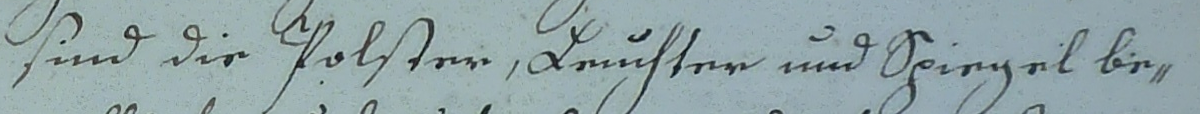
sind die Polster, Leuchter und Spiegel be¬
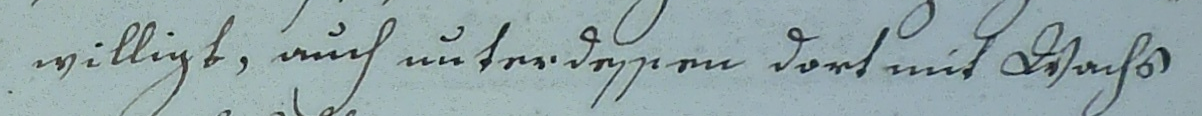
willigt, auch unterdessen dort mit Wachs
